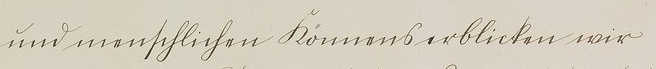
und menschlichen Könnens erblicken wir
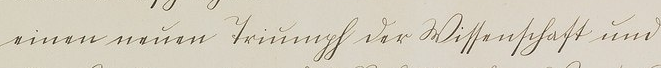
einen neuen Triumph der Wissenschaft und
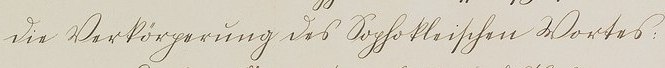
die Verkörperung des Sophokleischen Wortes:
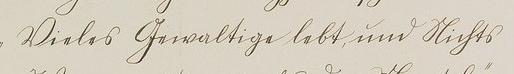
«Vieles Gewaltige lebt, und Nichts
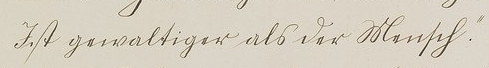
Ist gewaltiger als der Mensch.»
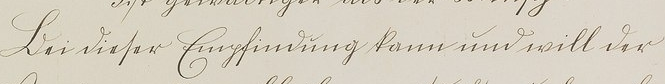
Bei dieser Empfindung kann und will der
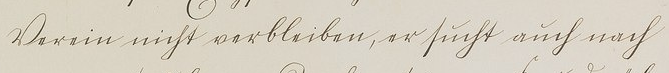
Verein nicht verbleiben, er sucht auch nach
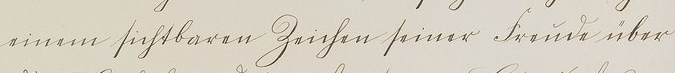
einem sichtbaren Zeichen seiner Freude über
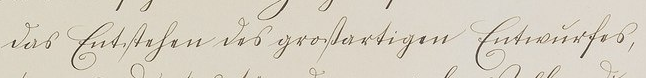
das Entstehen des großartigen Entwurfes,
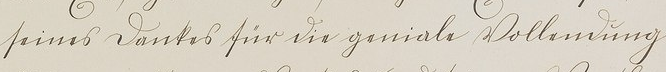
seines Dankes für die geniale Vollendung
